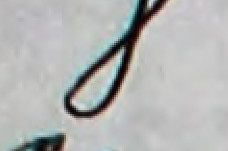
8
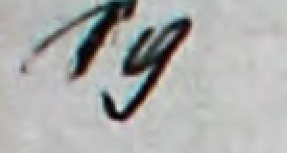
s 9
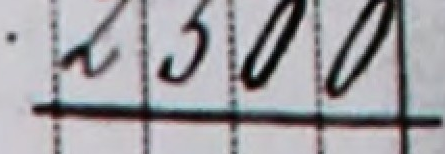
2500
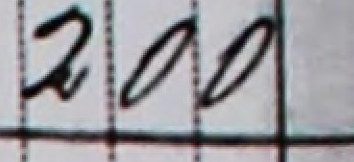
200
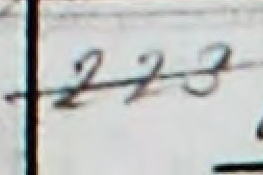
223 Präs: 1 Jänner 1920. T Z 223.
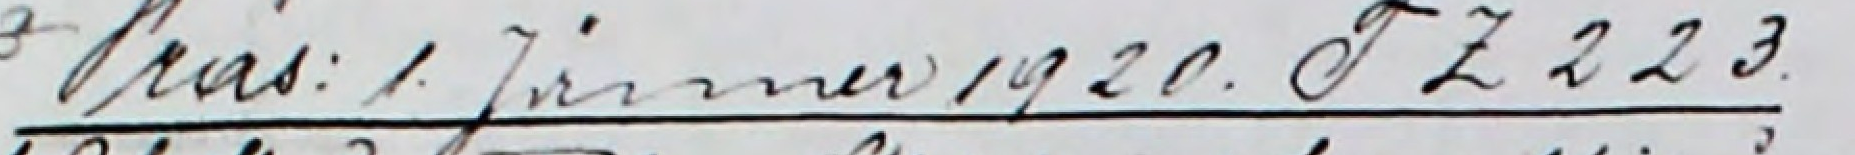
Auf Grund der Löschungsbewilligung vom 31. Mai 1920
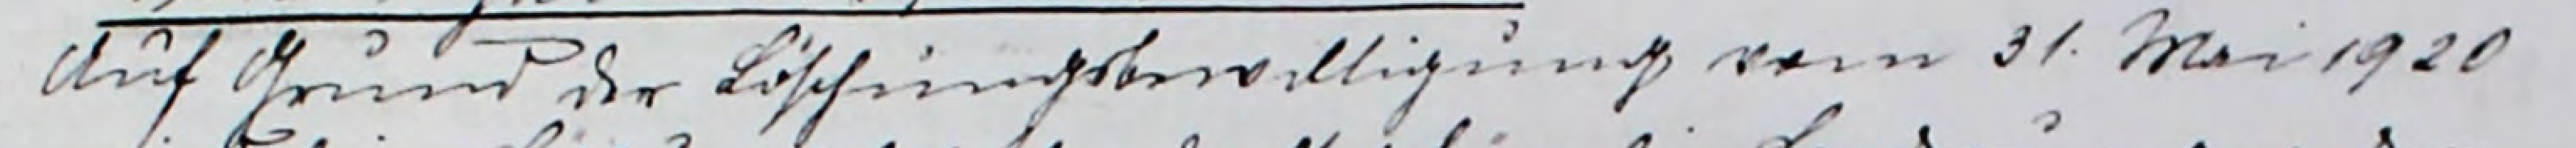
wird die Löschung des Pfandrechtes für die Forderungen der Sparkasse des Marktes Aussee:
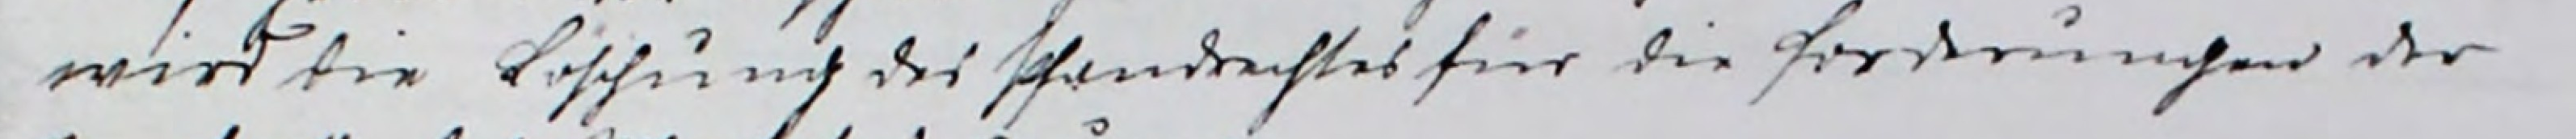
a. Postz 1 von 700 fl oder 1400 k samt Anhang;
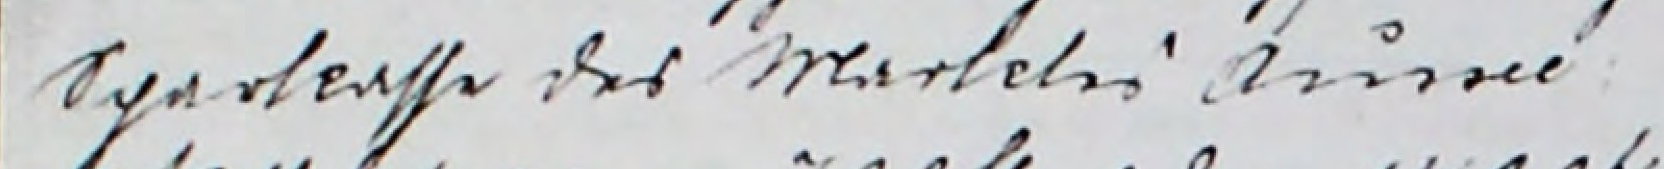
b. „ 3 von 700 fl oder 1400 k samt Anhang;
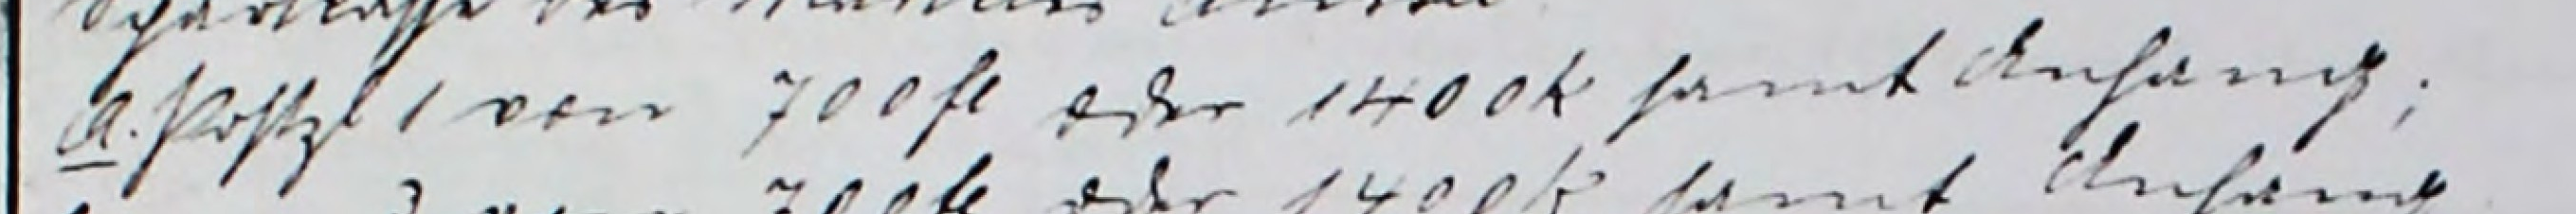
c. „ 6 von 600 k samt Anhang;
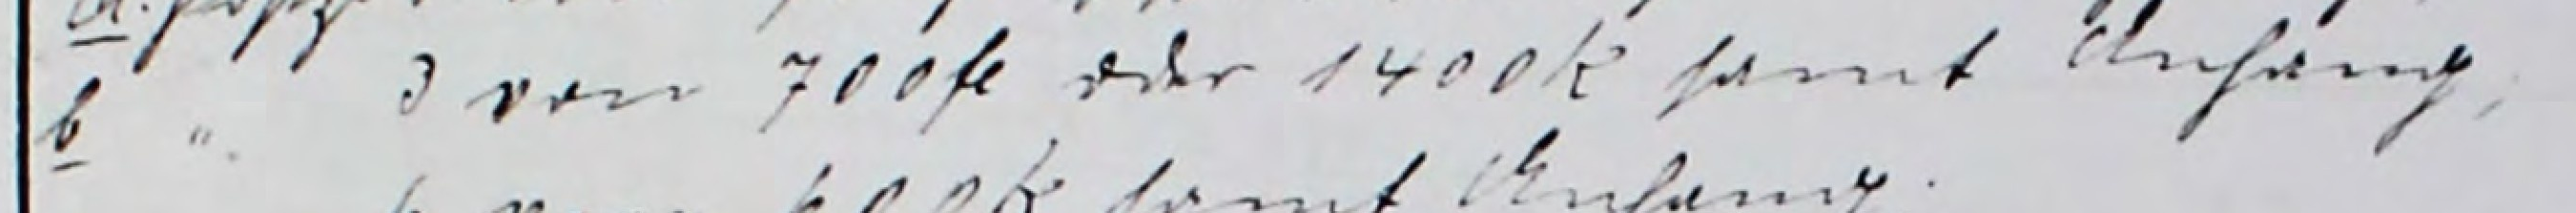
d. „ 7 von 800 k samt Anhang und
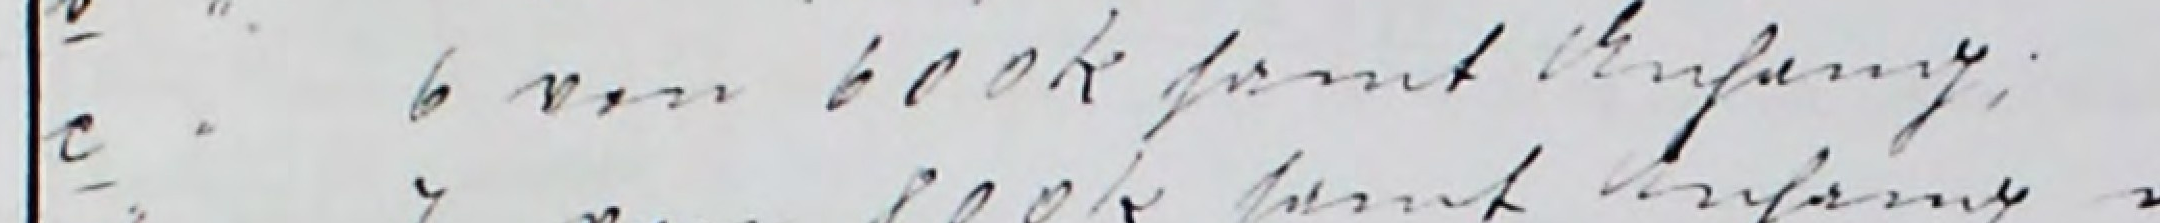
e. „ 8 von 2500 k samt Anhang - einverleibt.
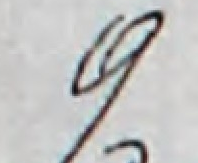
9
